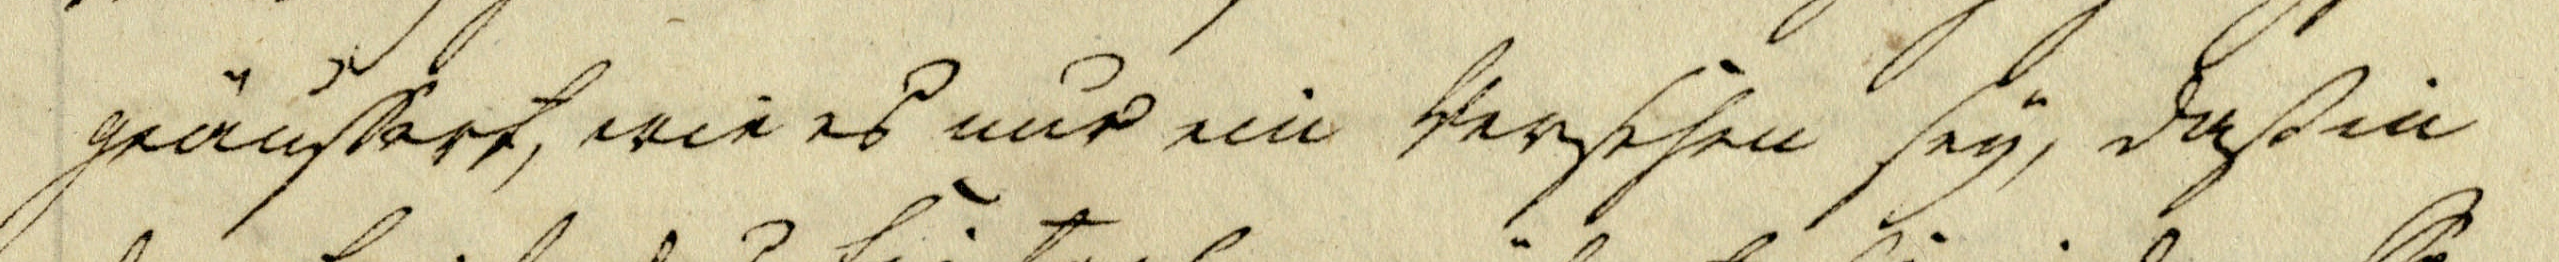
geäussert, wie es nur ein Versehen seÿ, daß in
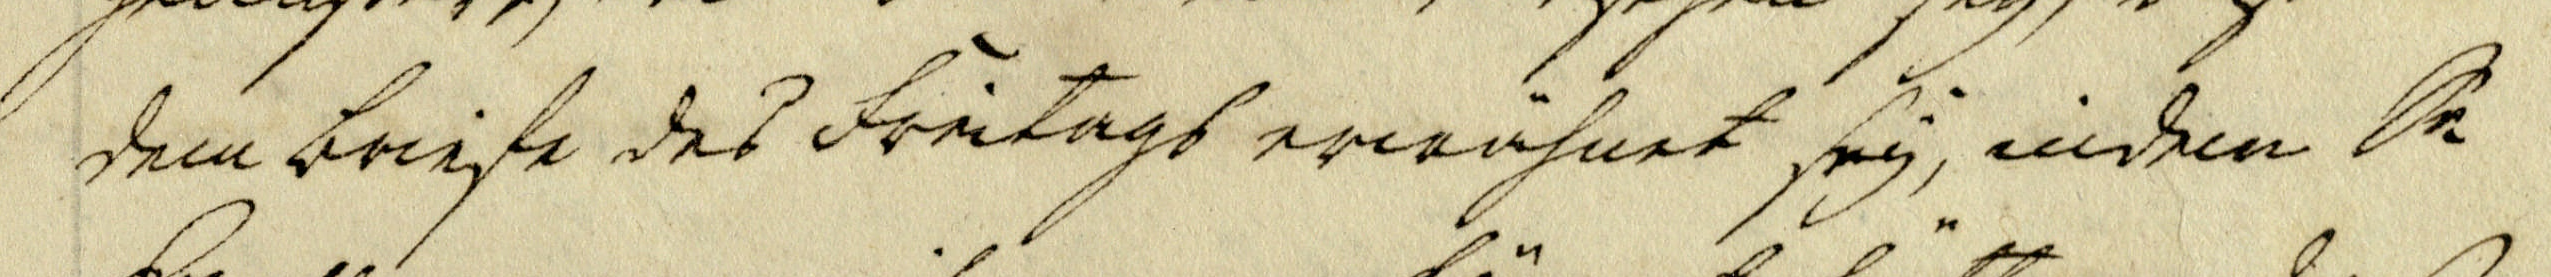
dem Briefe des Freitags erwähnet seÿ, indem Sr
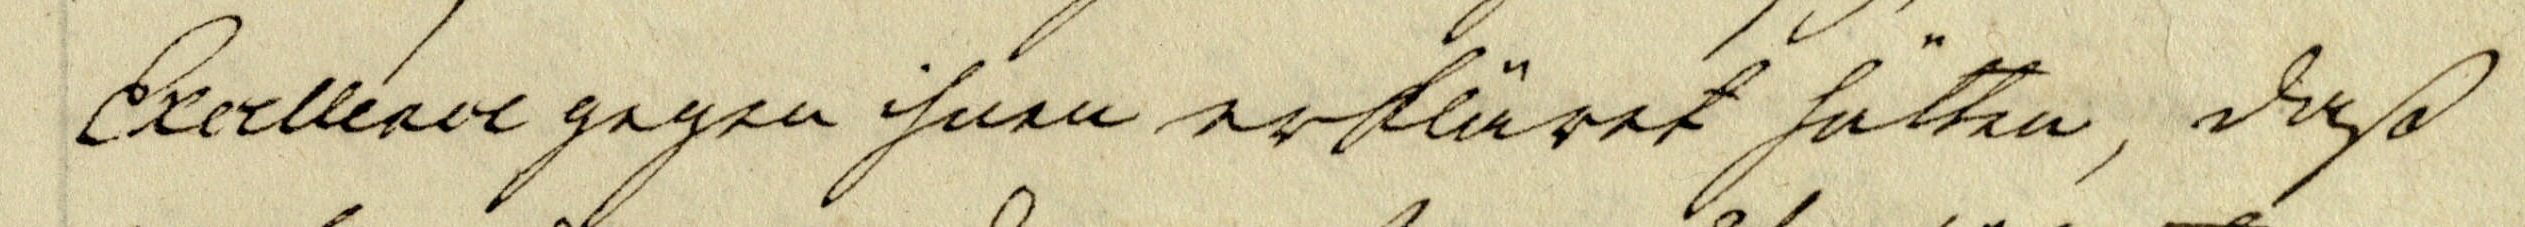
Excellence gegen ihnen erkläret hätten daß
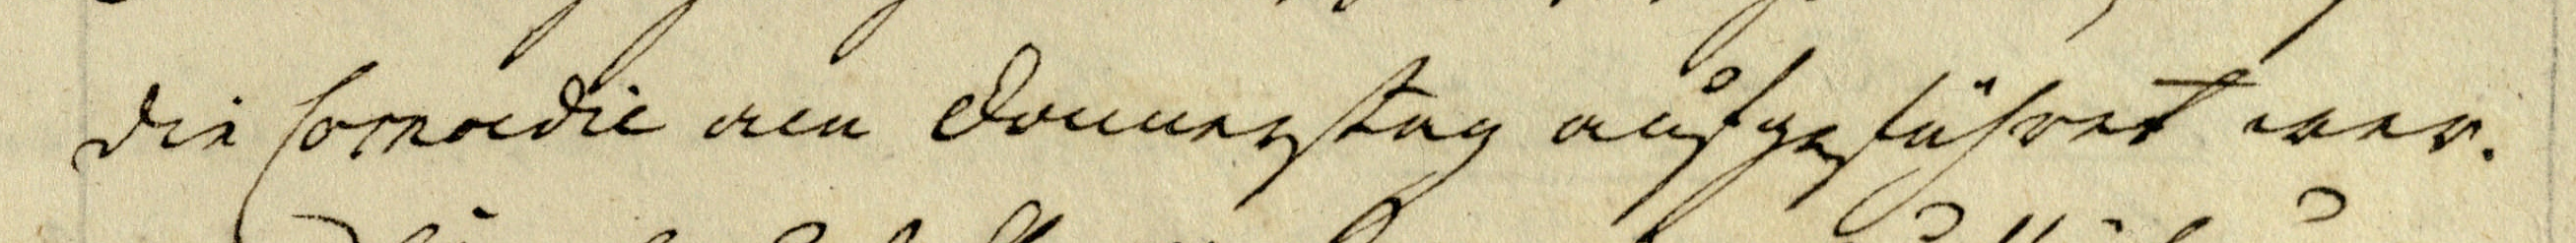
die Comoedie am Donnerstag aufgeführet wer¬
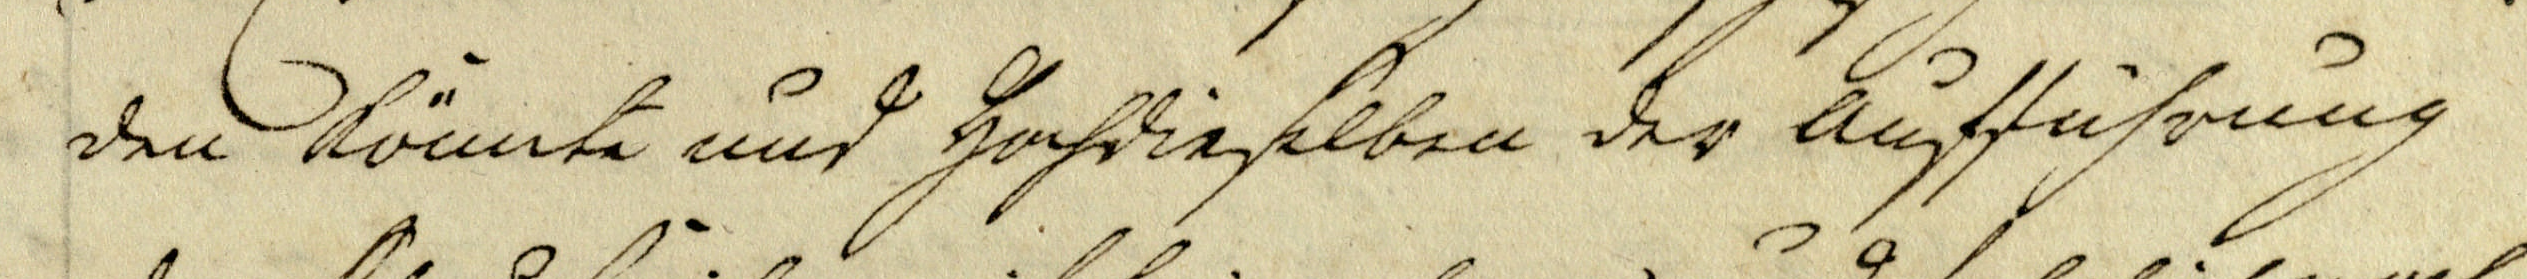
den könnte und Hochdieselben der Aufführung
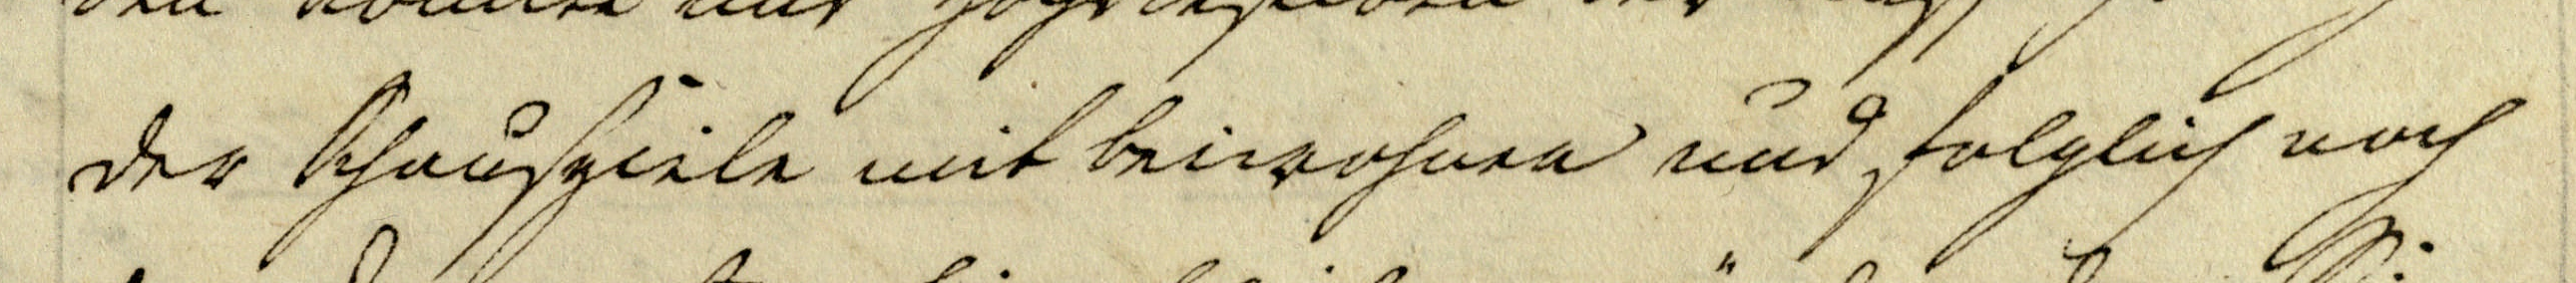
der Schauspiele mit beiwohnen und folglich noch
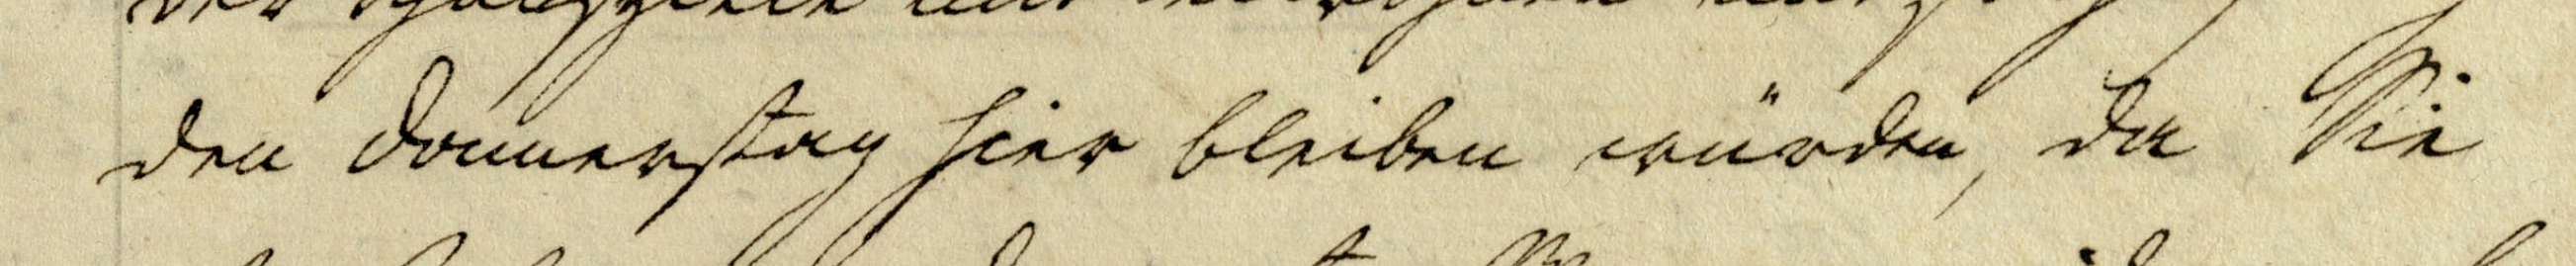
den Donnerstag hier bleiben würden, da Sie
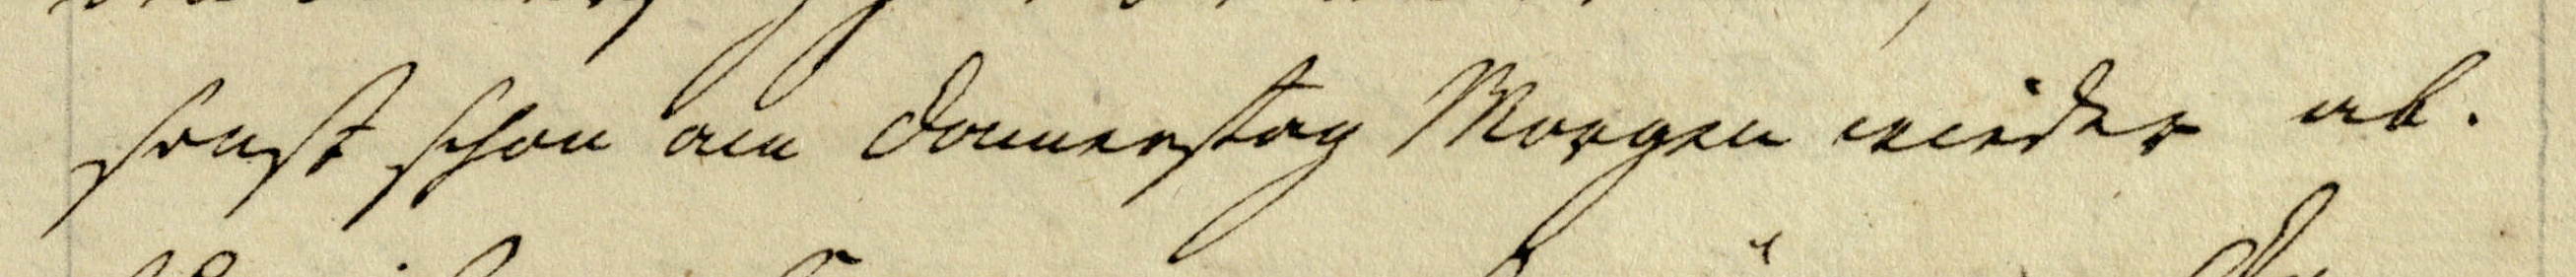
sonst schon am Donnerstag Morgen wieder ab¬
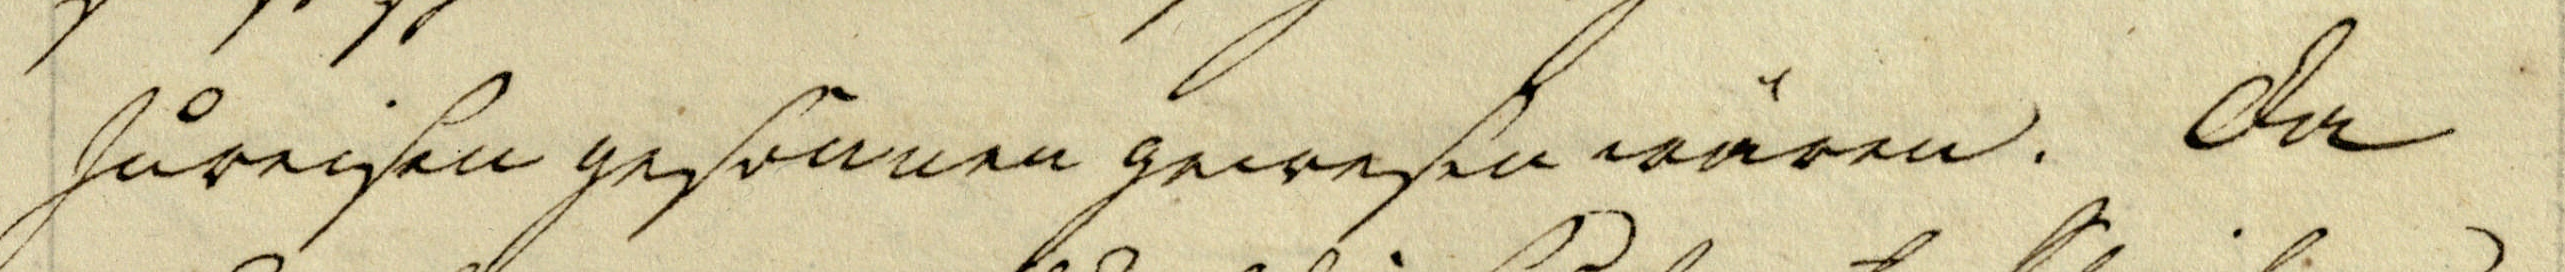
zureisen gesonnen gewesen wären. Da
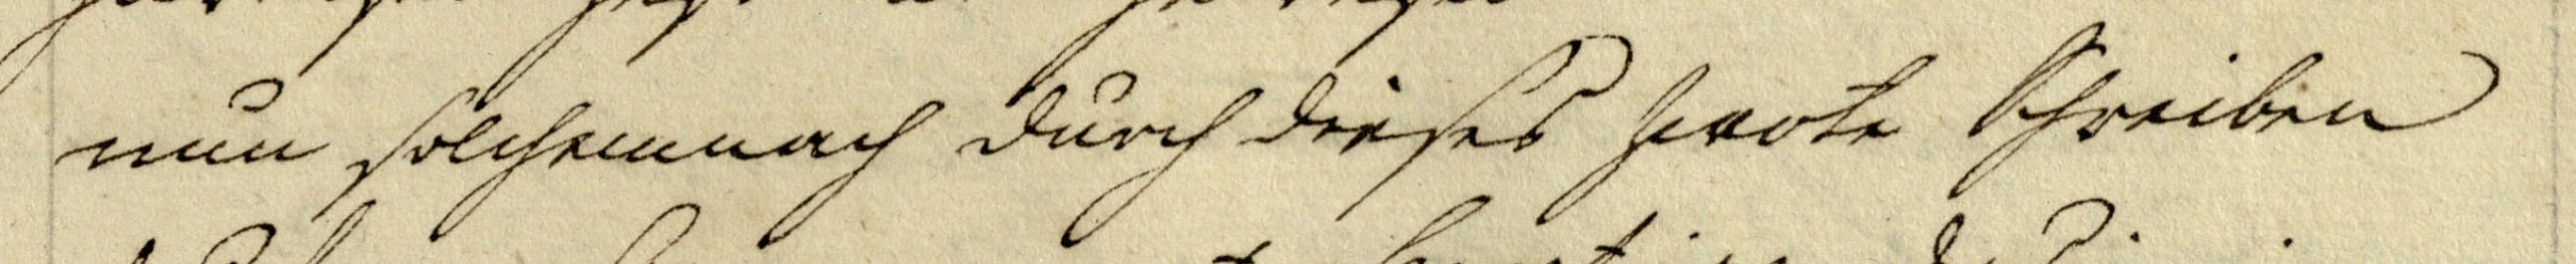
nun solchemnach durch dieses zwote Schreiben
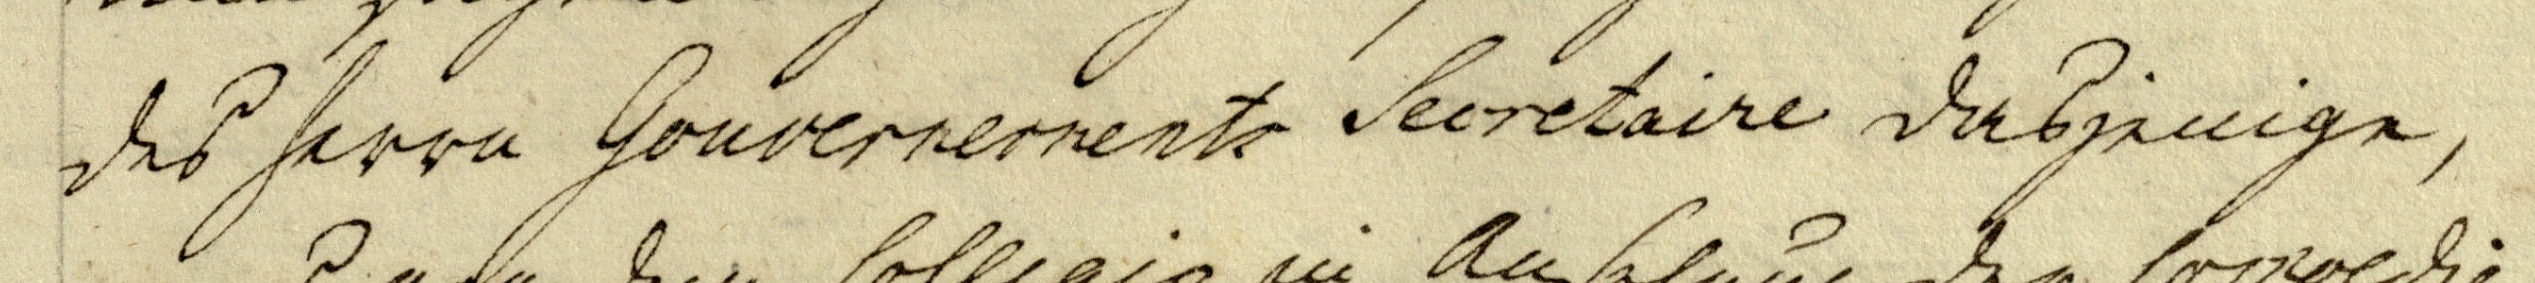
des Herrn Gouvernements Secretaire dasjenige,
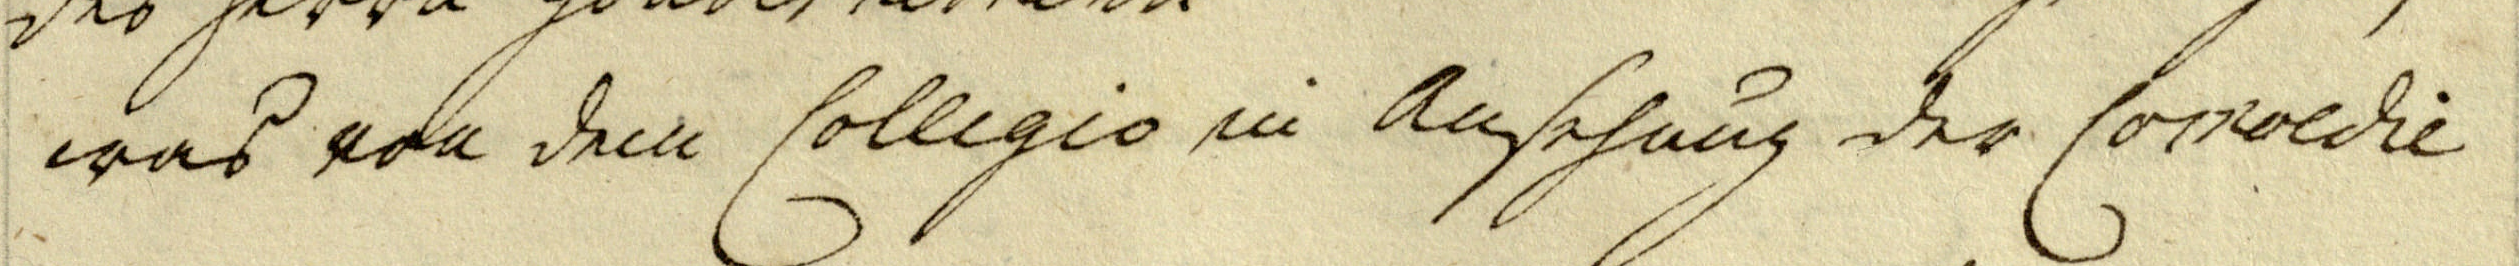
was da dem Collegio in Ansehung der Comoedie
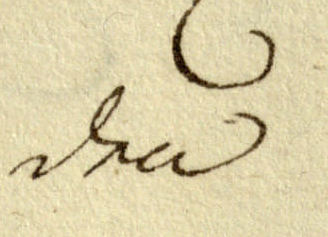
den
